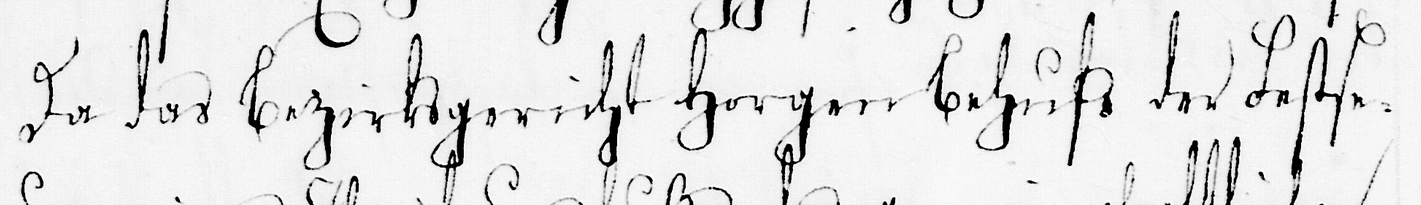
Da das Bezirksgericht Horgen Behufs der Festse¬
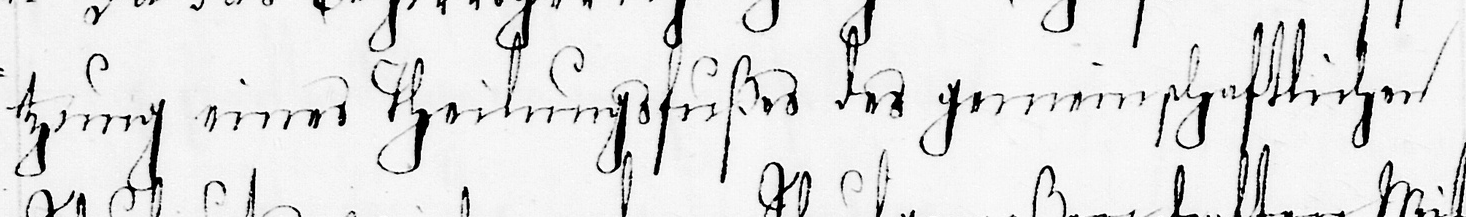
tzung eines Theilungsfußes des gemeinschaftlichen
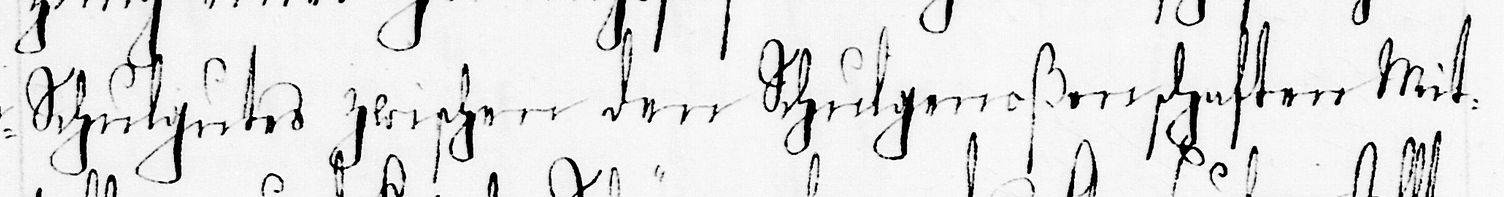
Schulgutes zwischen den Schulgenoßenschaften Mit¬
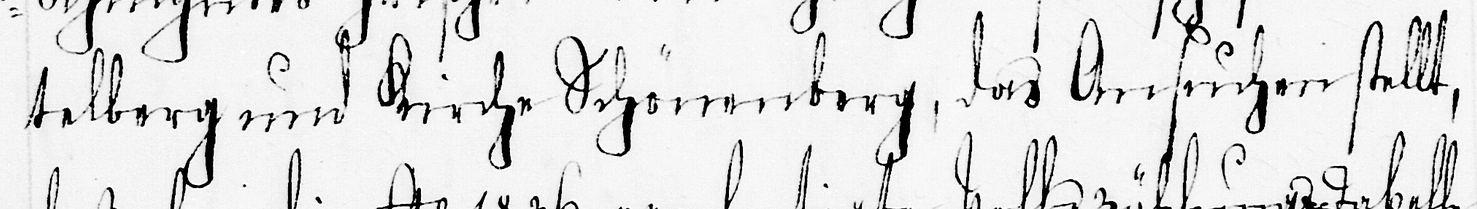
telberg und Kirche Schönenberg, das Ansuchen stell¬
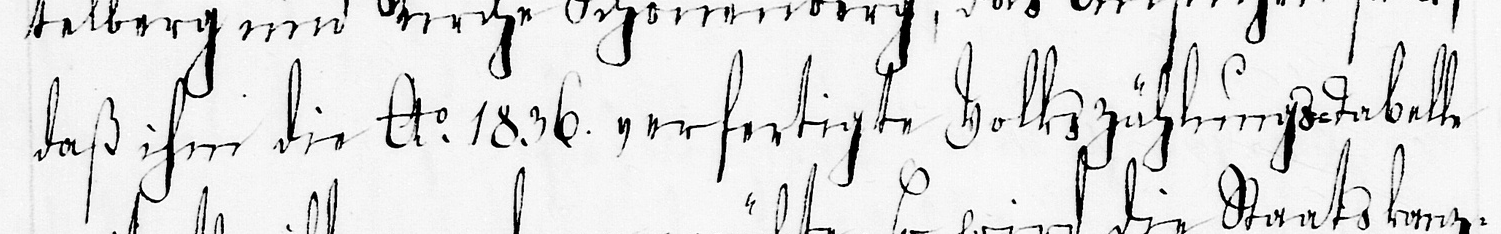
daß ihm die Ao. 1836. verfertigte Volkszählungs-Tabelle
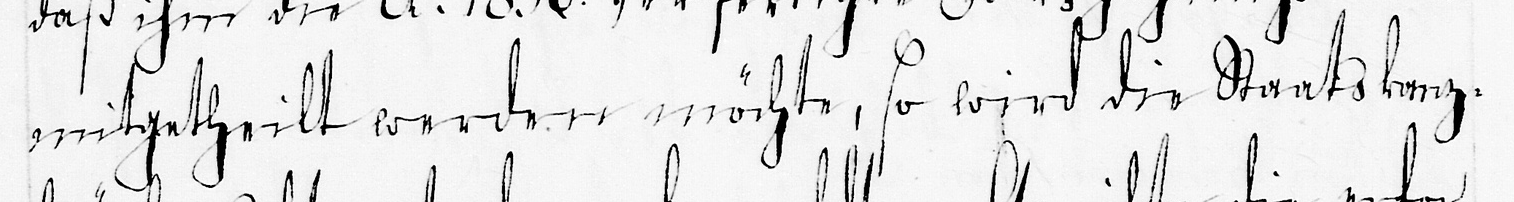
mitgetheilt werden möchte, so wird die Staatskanz¬
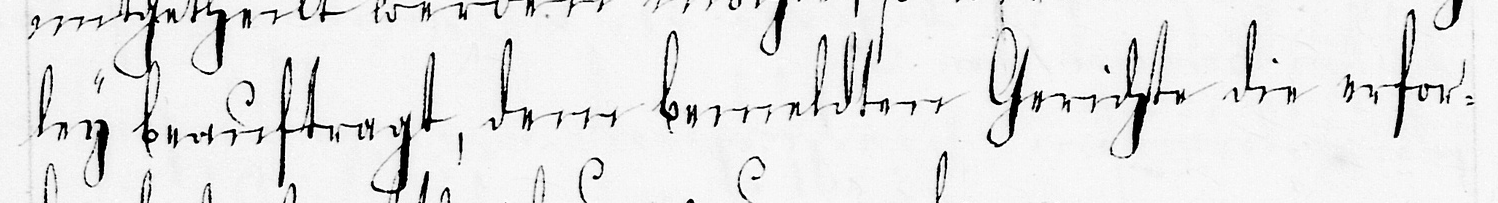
ley beauftragt, dem bemeldten Gerichte die erfor¬
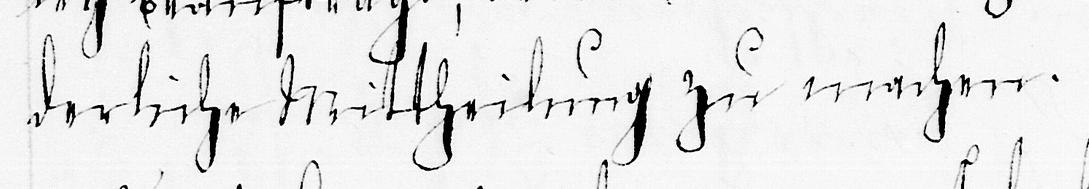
derliche Mittheilung zu machen.
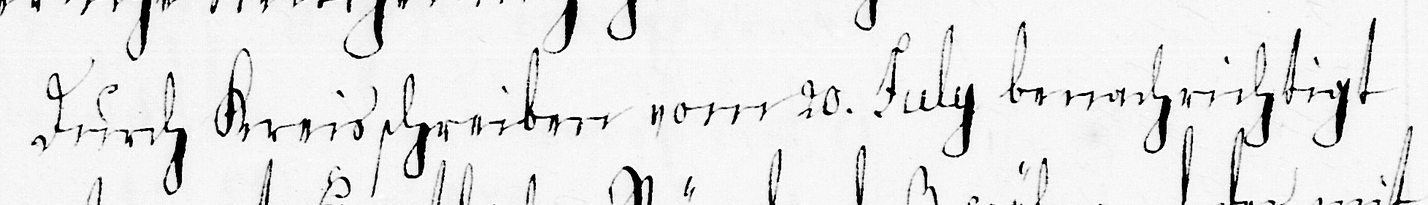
Durch Kreisschreiben vom 20. July benachrichtigt
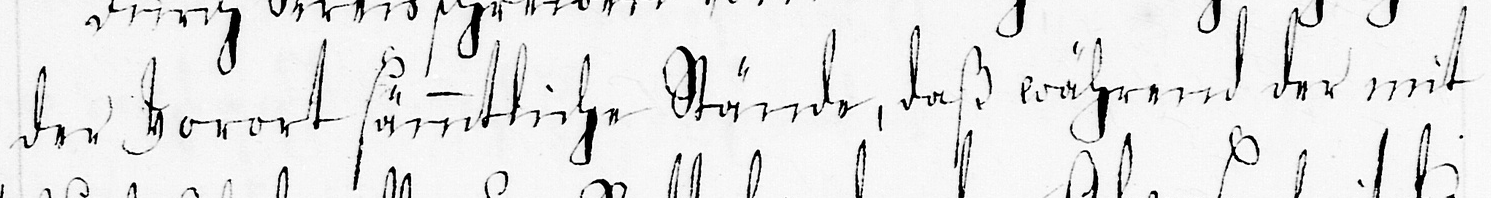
der Vorort sämmtliche Stände, daß während der mit
